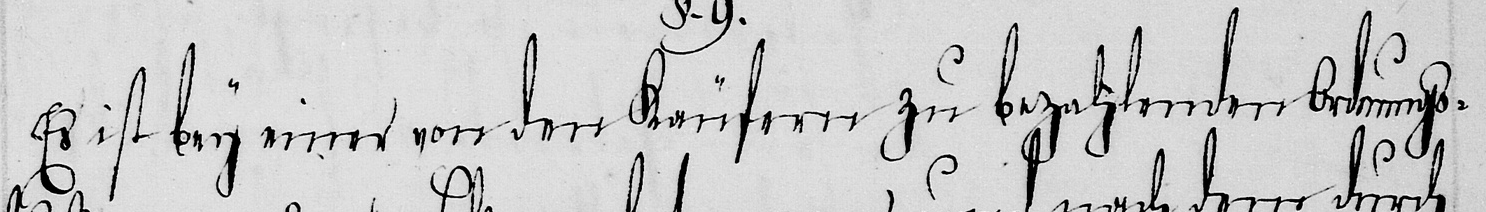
ist bey einer von den Käufern zu bezahlenden Ordnung¬
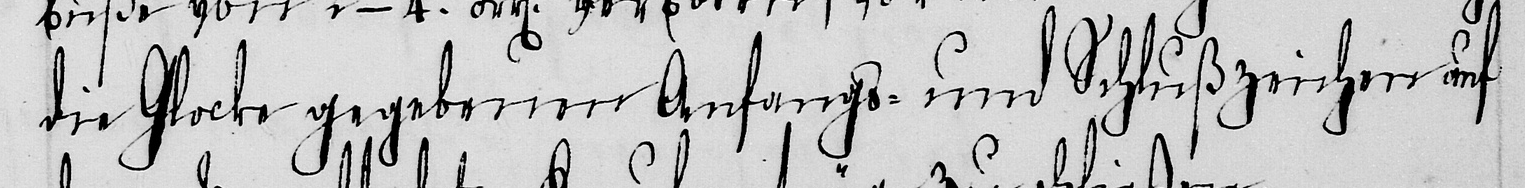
die Glocke gegebenen Anfangs- und Schlußzeichen auf
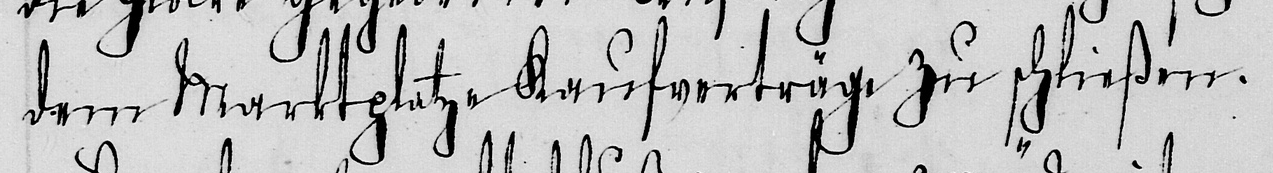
dem Marktplatze Kaufverträge zu schließen.
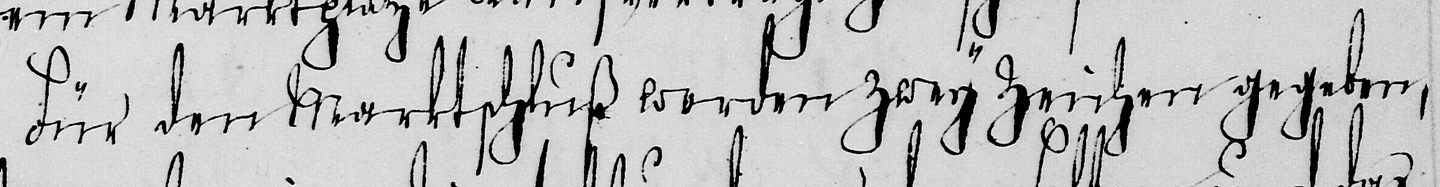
Für den Marktschluß werden zwey Zeichen gegeben,
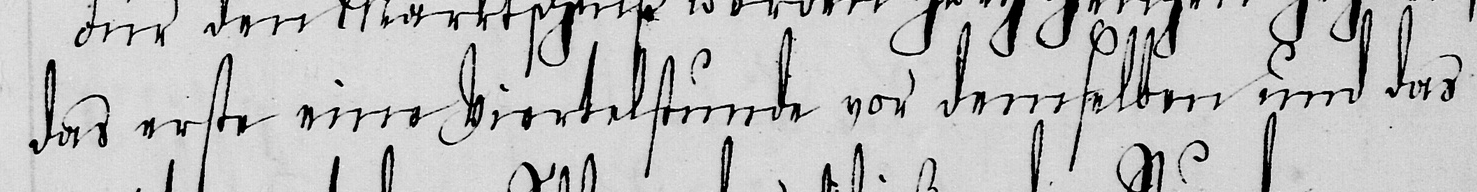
das erste eine Viertelstunde vor demselben und das
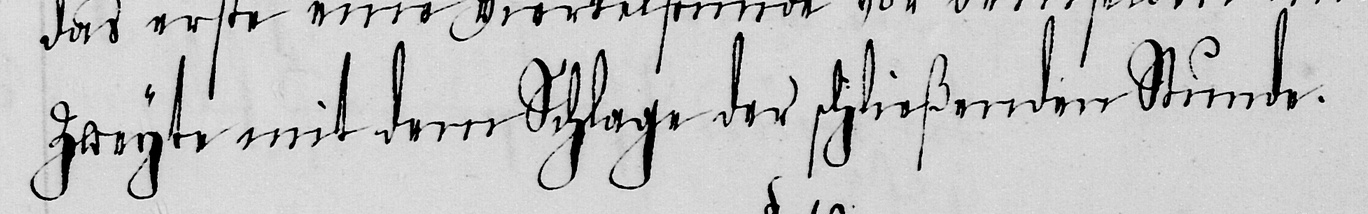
zweyte mit dem Schlage der schließenden Stunde.
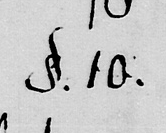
§. 10.
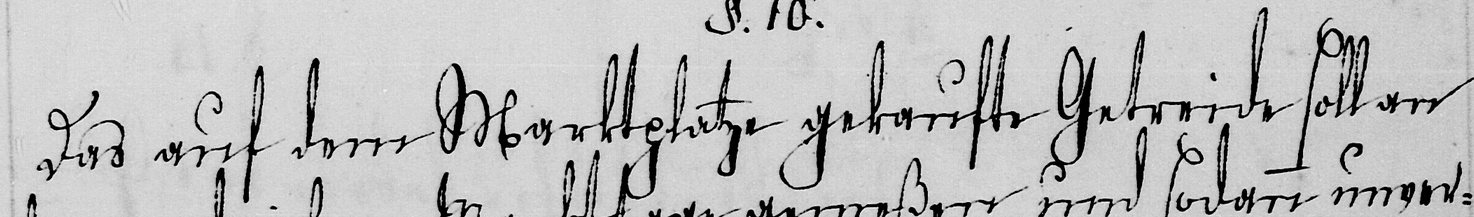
Das auf dem Marktplatze gekaufte Getreide soll an
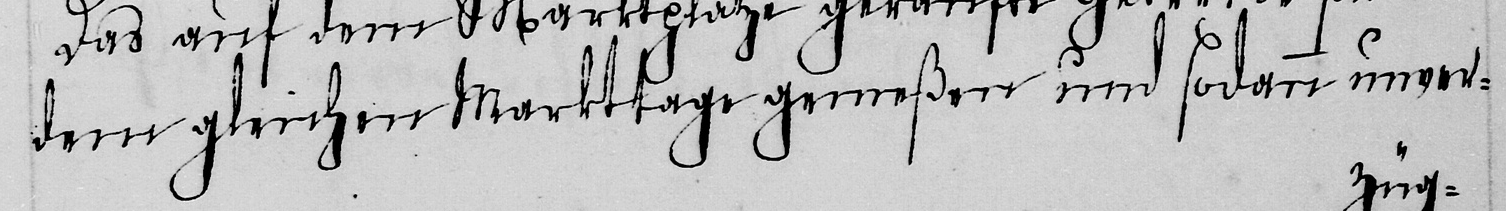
dem gleichen Markttage gemeßen und sodann unver-
